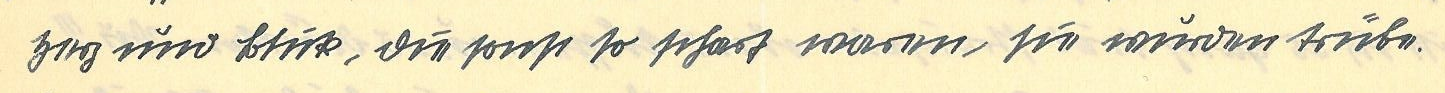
Herz und Blick, die sonst so scharf waren, sie wurden trübe.
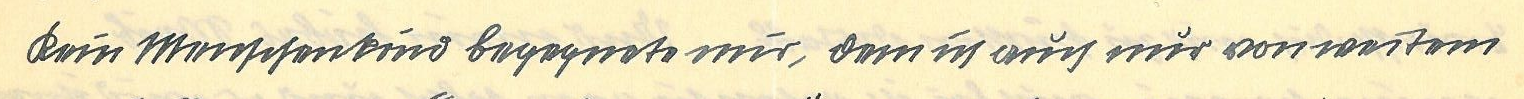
Kein Menschenkind begegnete mir, dem ich auch nur von weitem
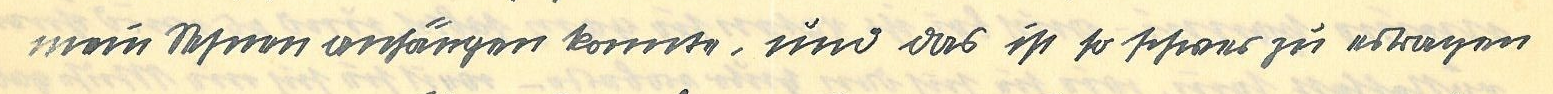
mein Sehnen anhängen konnte, und das ist so schwer zu ertragen
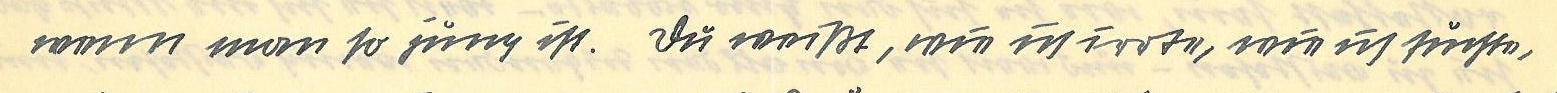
wenn man jung ist. Du weißt, wie ich irrte, wie ich suchte,
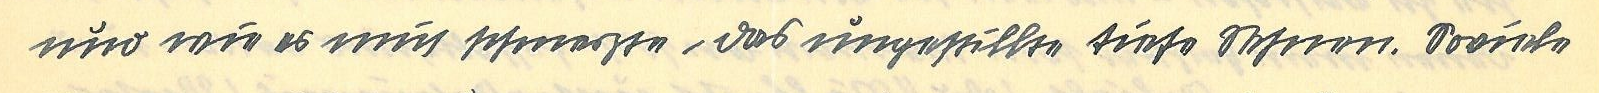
und wie es mich schmerzte, das ungestillte tiefe Sehnen. Soviele
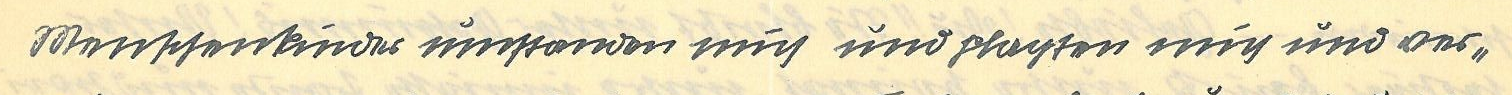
Menschenkinder umstanden mich und plagten mich und ver¬
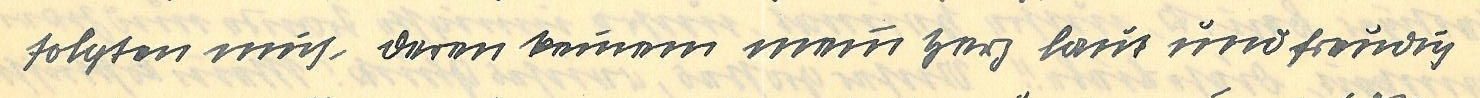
folgten mich, deren keinem mein Herz laut und freudig
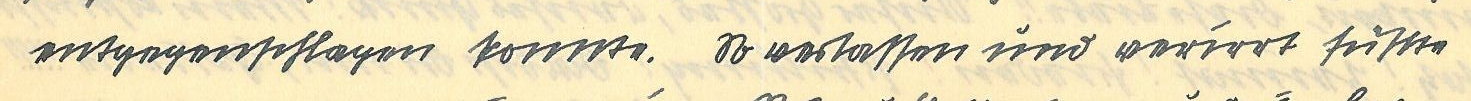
entgegenschlagen konnte. So verlassen und verirrt fühlte
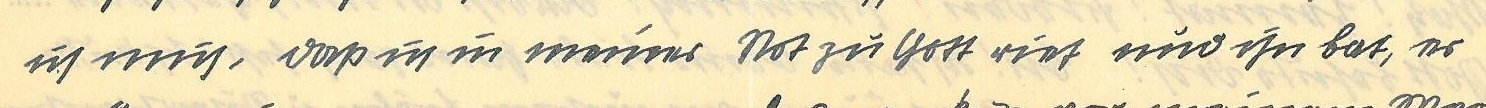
ich mich, daß ich in meiner Not zu Gott rief und ihn bat, er
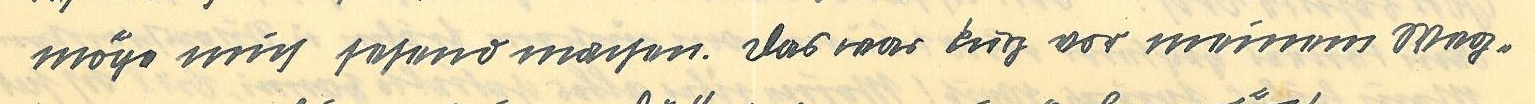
möge mich sehend machen. Das war kurz vor meinem Weg¬
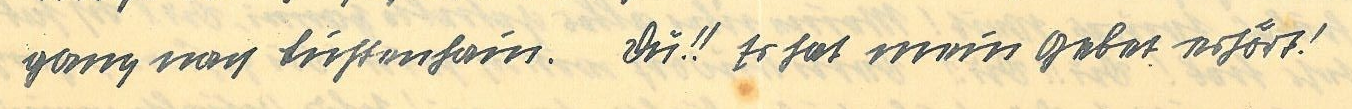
gang nach L. Du!! Er hat mein Gebet erhört!
